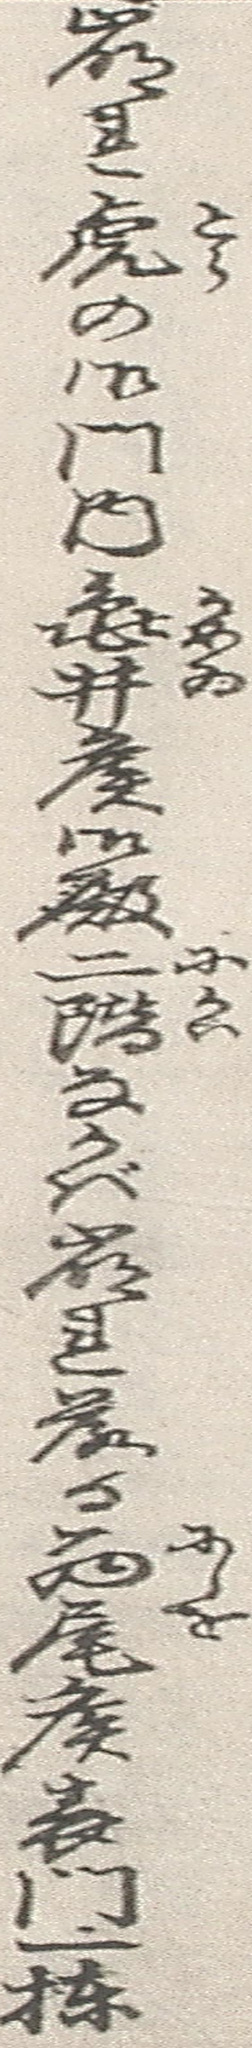崩れ虎の御門内亀井矦御殿二階なかバ崩れ落る西尾矦表門一棟
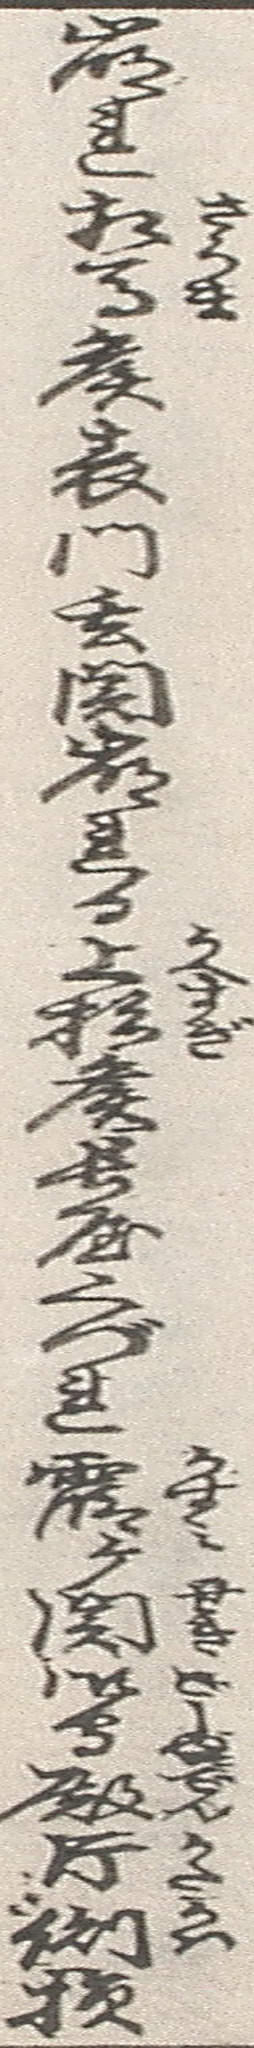崩れ相馬矦表門玄関崩れる上杉矦長屋くづれ霞ヶ関御守殿片側損
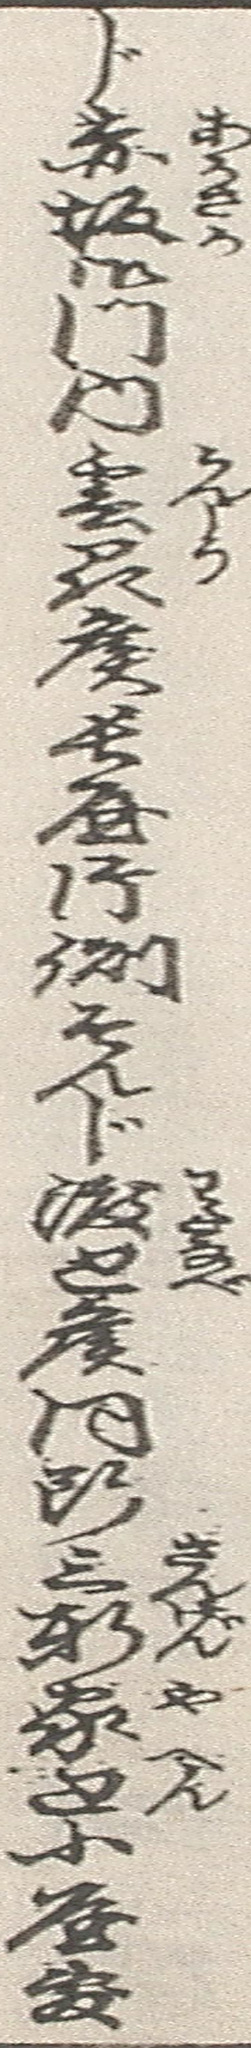じ赤坂御門内雲州矦長屋片側そんじ渡邊矦同断三軒家辺小屋敷
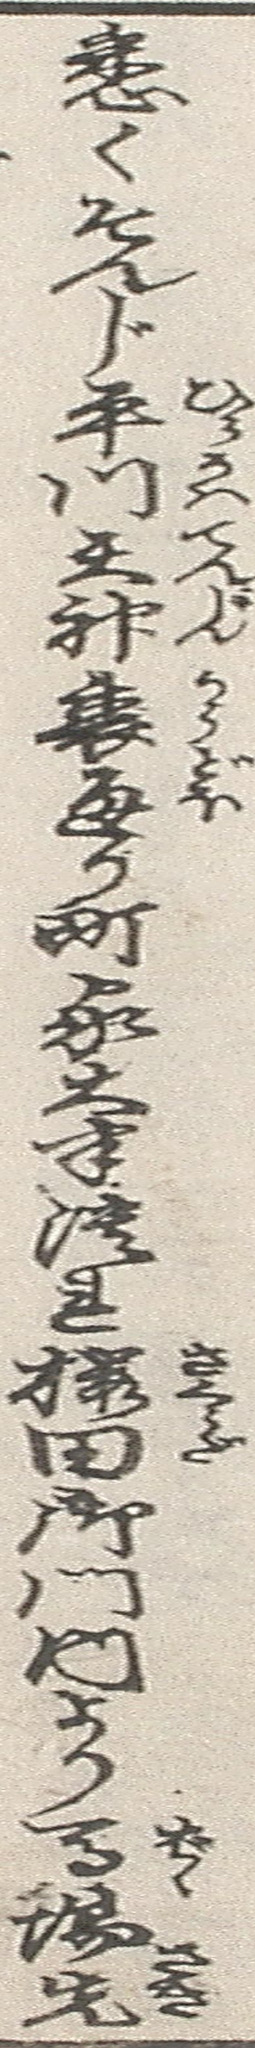悉くそんじ平川天神裏通り町家大半潰れ桜田御門内より馬場先
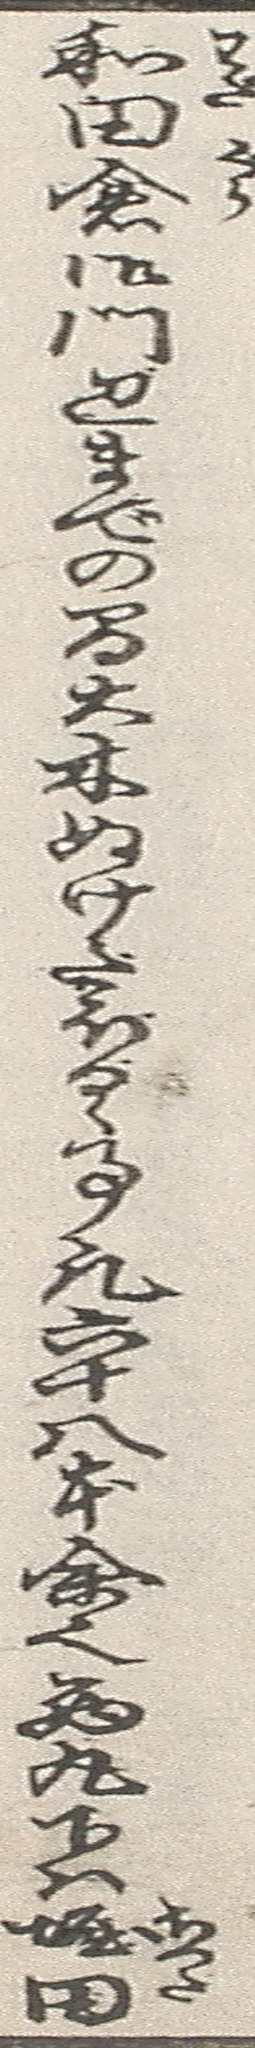和田倉御門辺までの間大木ぬけたほるゝ事凡六十八本余也西丸下ハ堀田
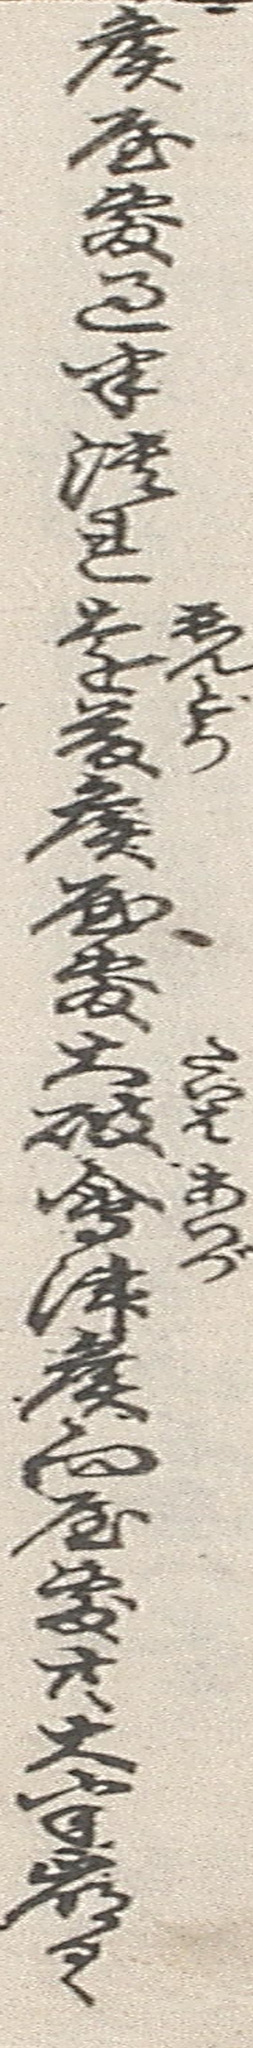矦屋敷過半潰れ遠藤矦屋敷大破会津矦向屋敷共大半崩るゝ
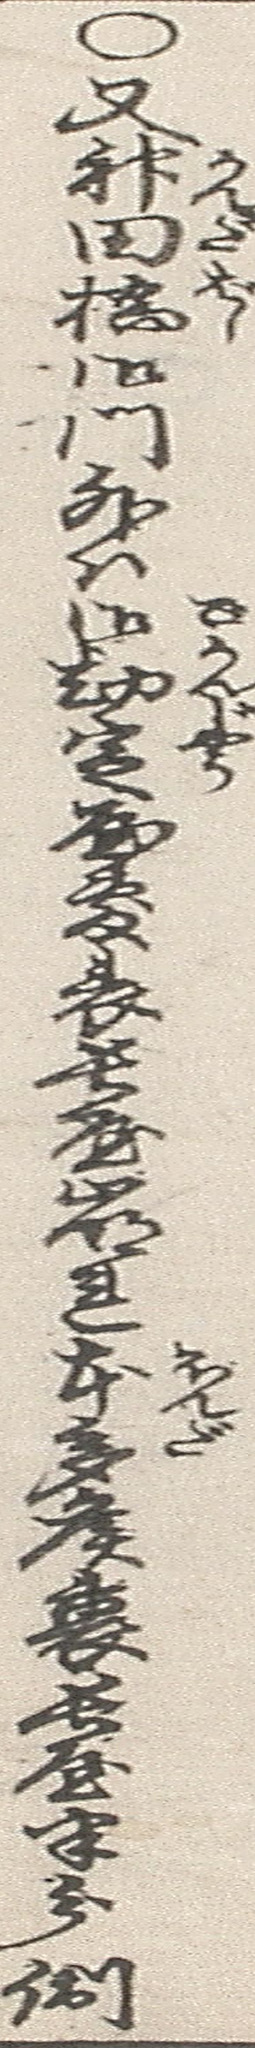◯又神田橋御門外ハ御勘定屋敷表長屋崩れ本多矦裏長屋半分倒
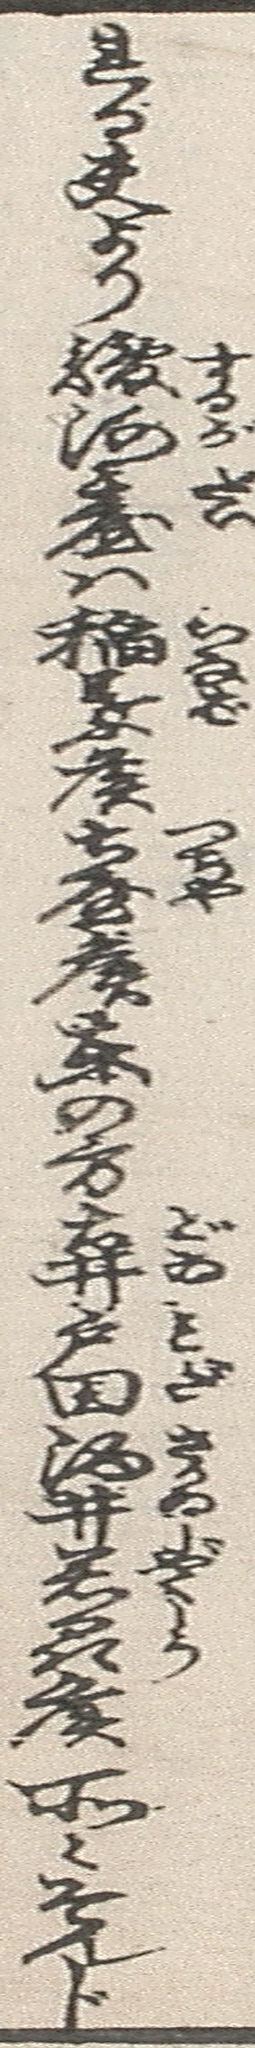れる夫より駿河台ハ稲葉矦土屋矦東の方土井戸田酒井若州矦所々そんじ
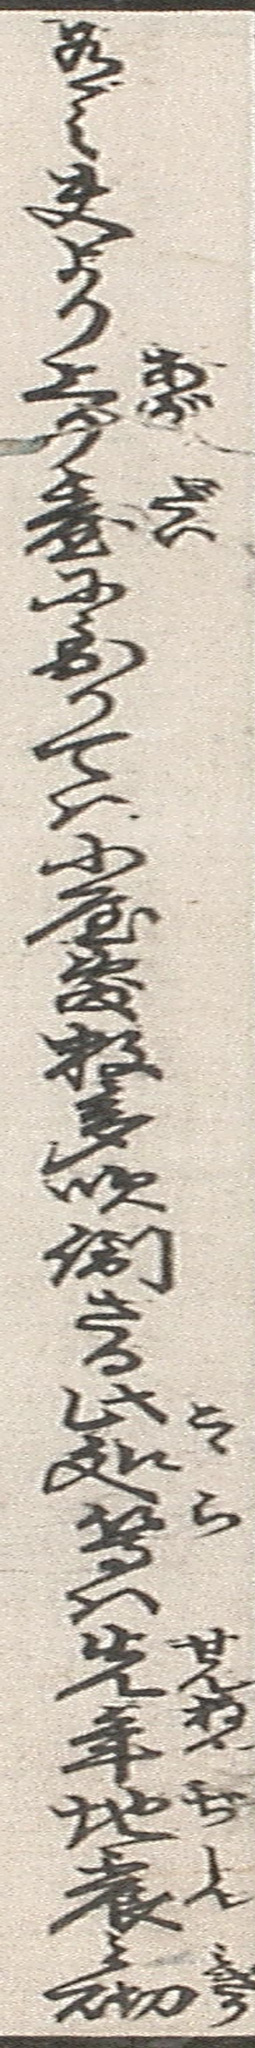有之夫より上り台に至りてハ小屋敷数多吹倒さる此処等ハ先年地震之砌
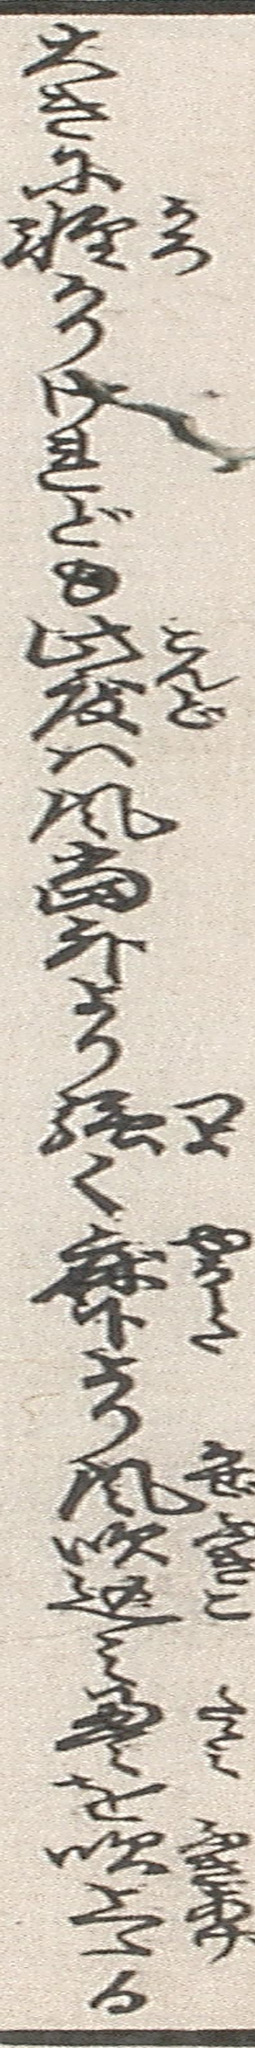大きに輕かりけれども此度ハ風当外より強く床下より風吹込ミ畳を吹上たる
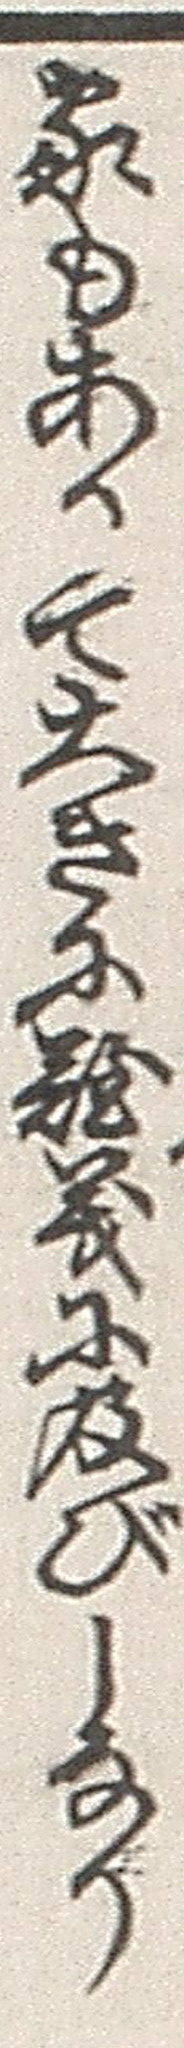家もありて大きに難義に及びしなり
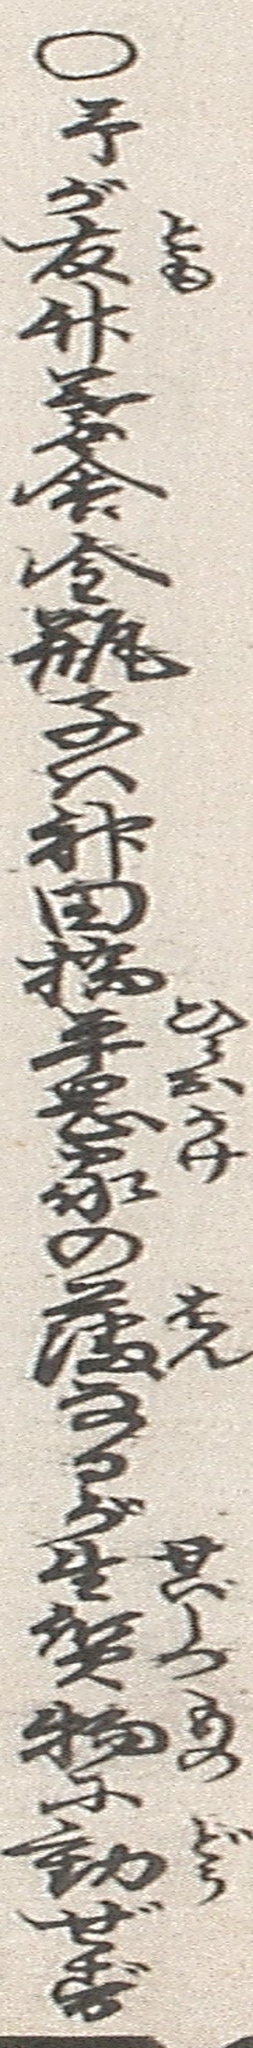◯予が友竹葉舎金瓶子ハ神田橋平岡家の藩なるが生質物に動ぜず
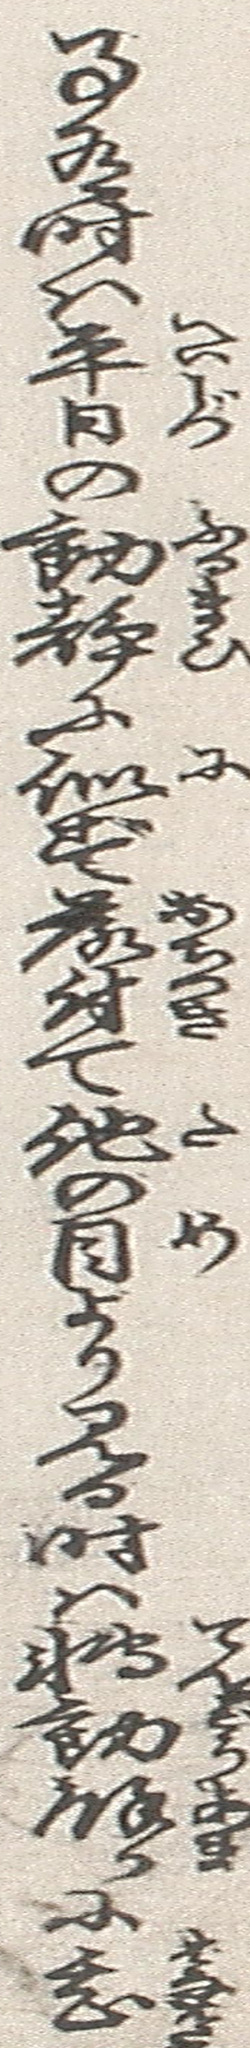事有時ハ平日の動静に似ず落付て他の目より見る時ハ転動餘りに甚
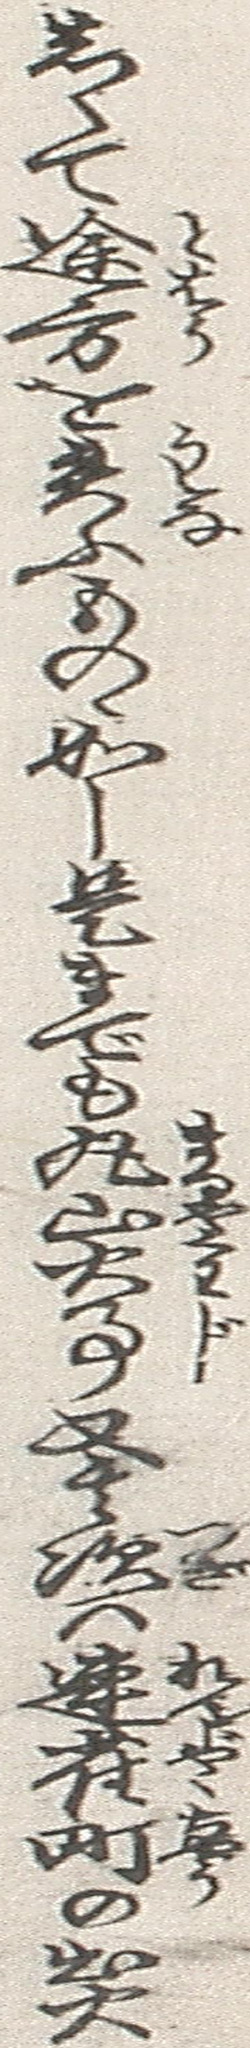しくて途方を失ふものゝ如し是までも丸山火事又其次ハ連雀町の出火
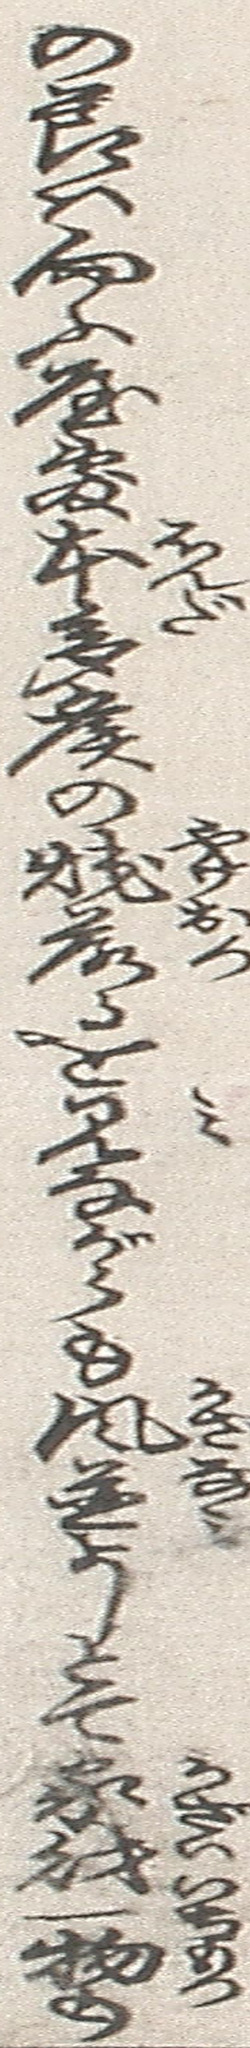の節ハ向ふ屋敷本多矦の焼落るを見ながらも風並よしとて家財一物も
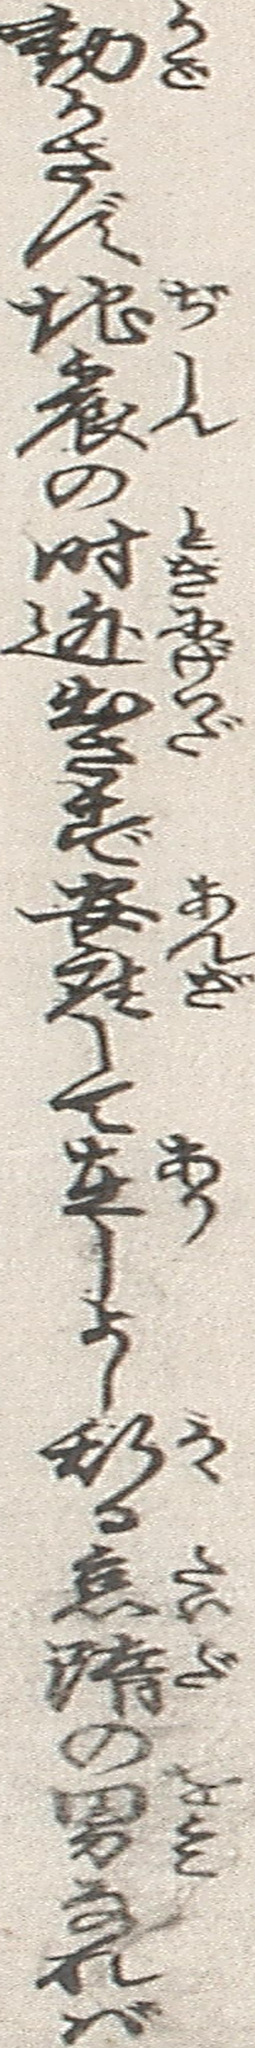動かさず地震の時逃出さず安座して在しよし斯る怠惰の男なれバ
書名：安政風聞集　上中下　全
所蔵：東京大学地震研究所図書室 Earthquake Research Institute Library, The University of Tokyo, JAPAN
